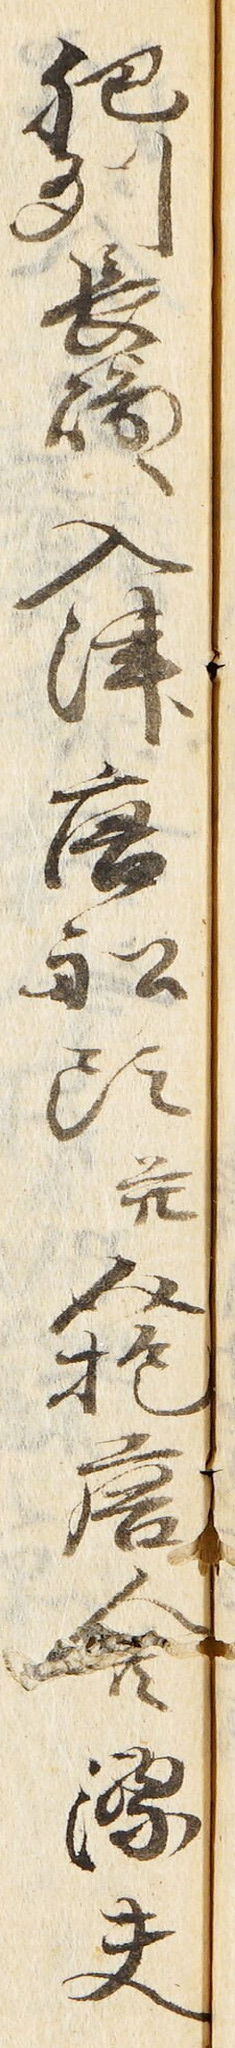肥州長崎へ入津唐船頭并介抱唐人共漂夫
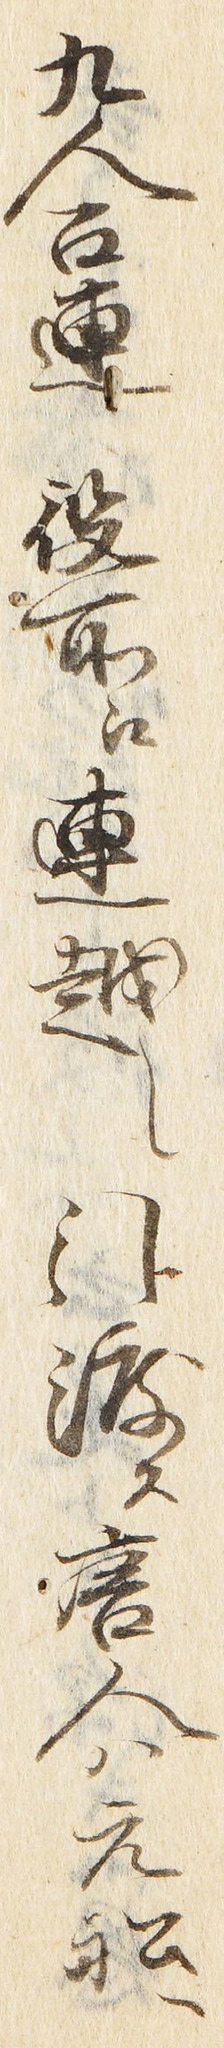九人召連役所連越し引渡唐人は元船へ
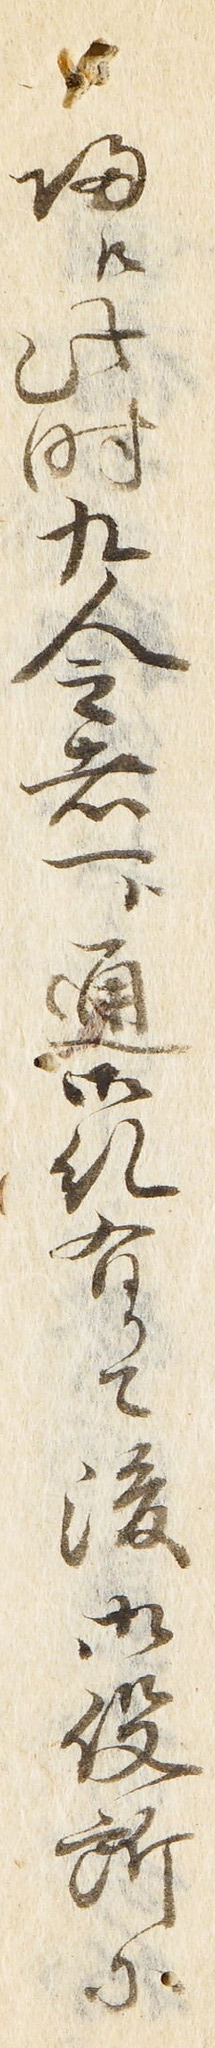帰る此時九人之者一と通御糺有りて後御役所に
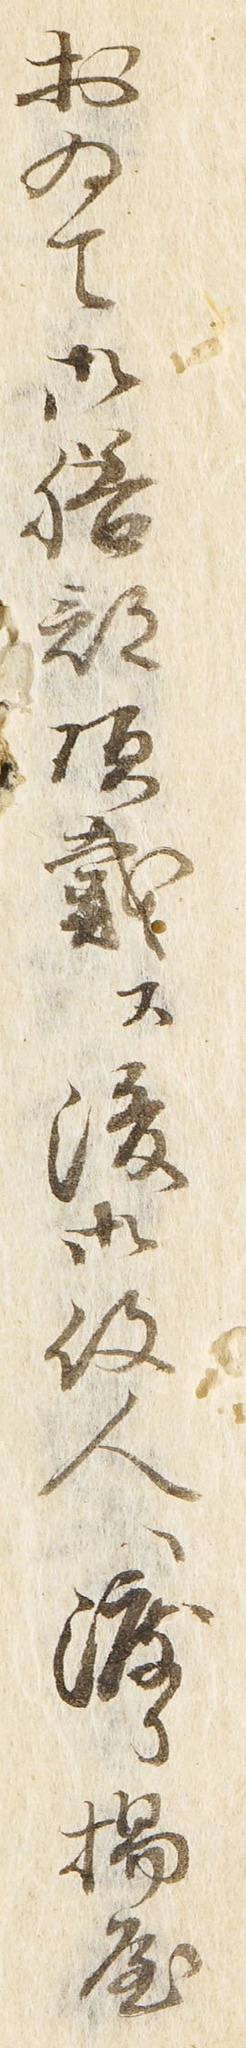おゐて御膳部頂戴す後御役人へ渡り揚屋
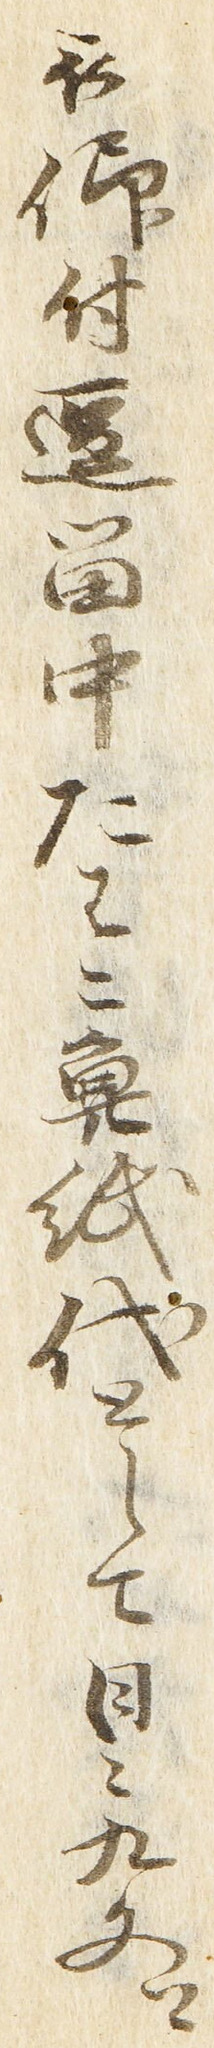被仰付逗留中たはこ鼻紙代として日々九文ツヽ
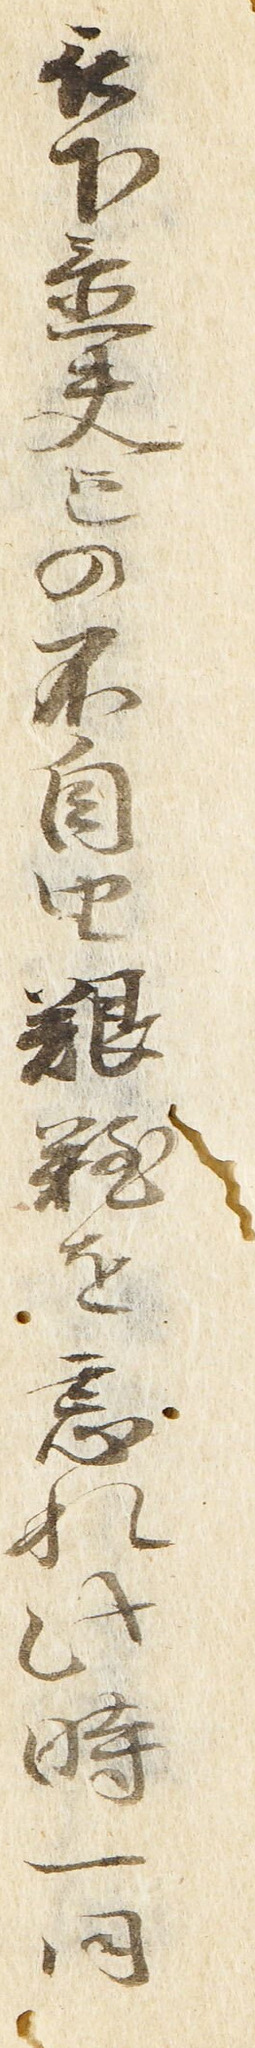被下置夫迄の不自由河南艱難を忘れ此時一同

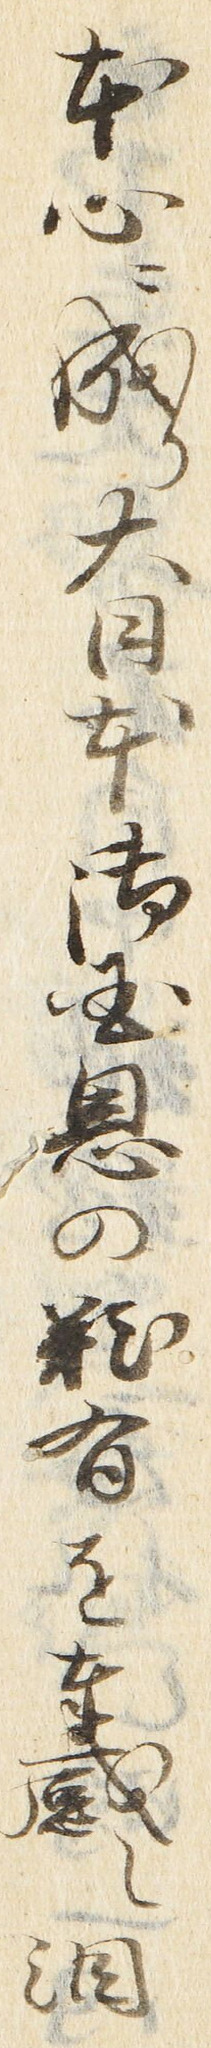本心に成り大日本御国恩の難有を奉感し泪
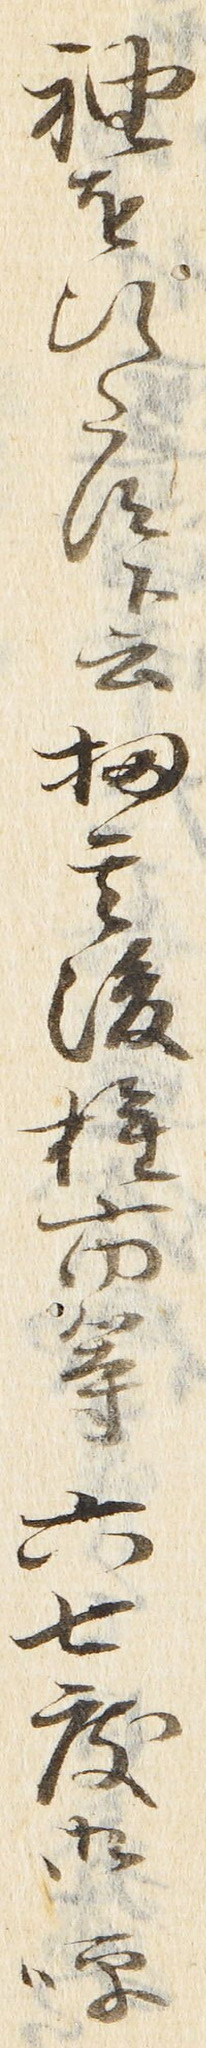袖をひたすと云扨其後権市等六七度御呼
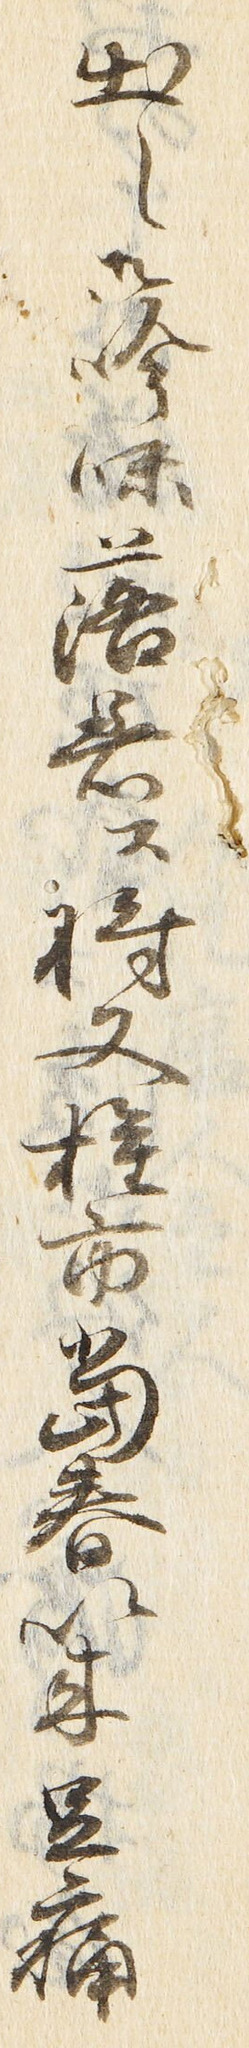出し御吟味ら落着す将又権市当春以来足痛
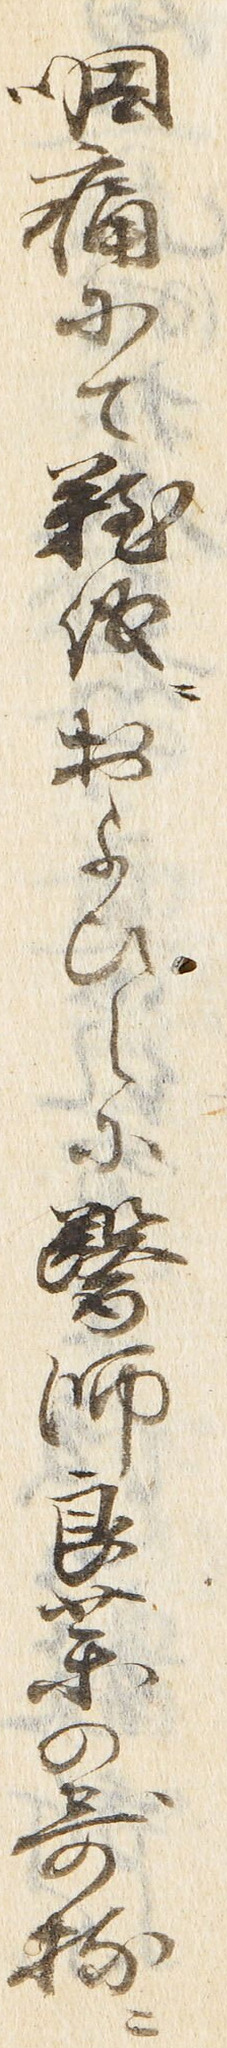咽痛んてな難儀におよひしに医師良薬の寄持に
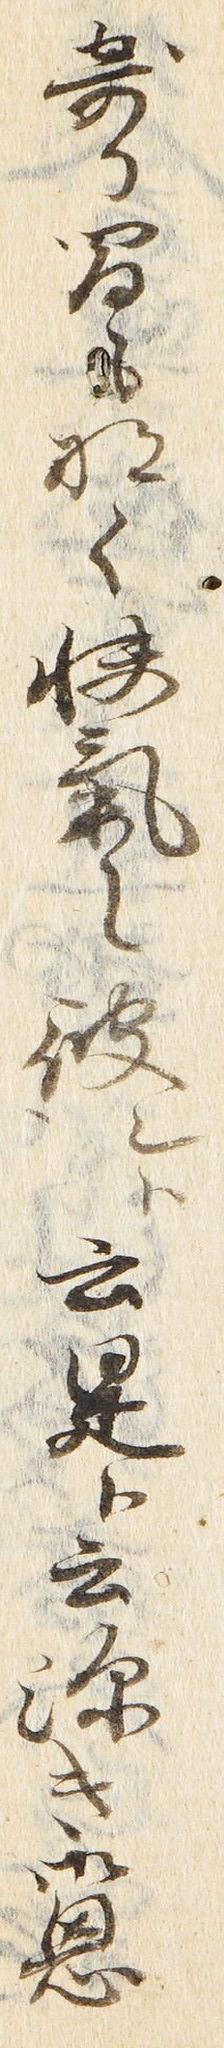寄り間もなく快気し彼れと云是と云深き御恩
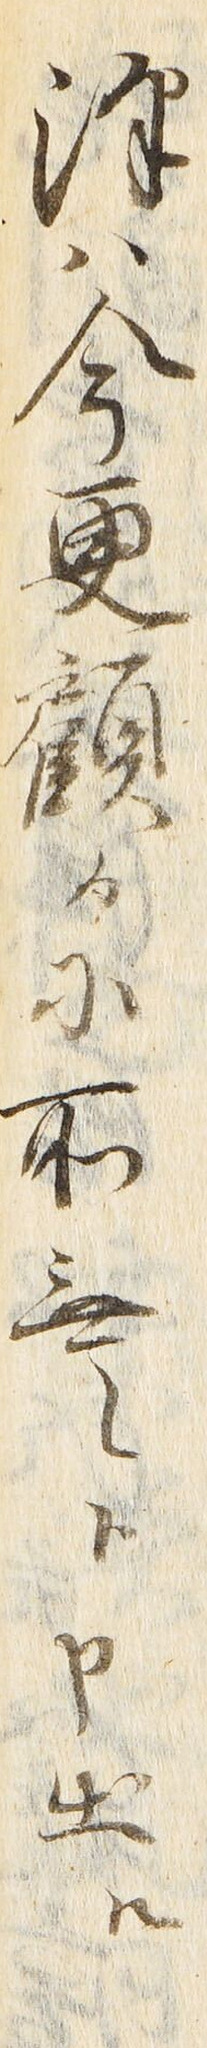沢は今更顧るに所無しと申出る
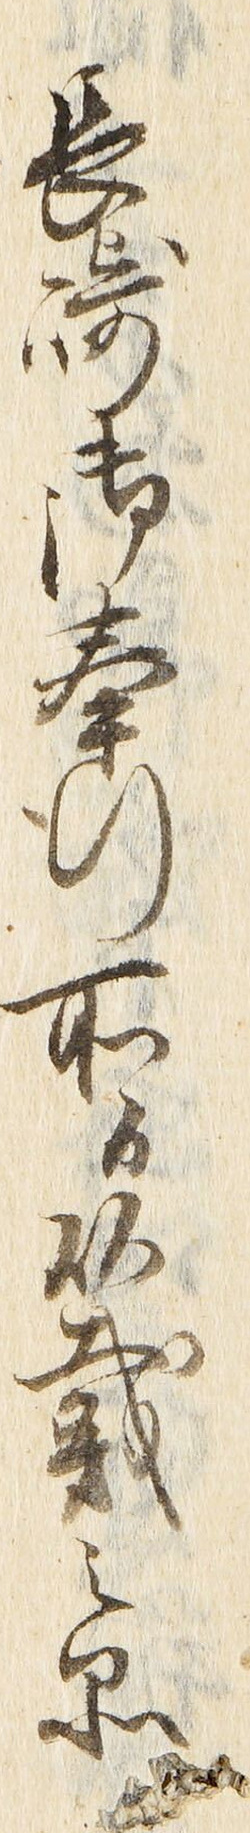長崎御奉行所ゟ頂戴ノ品
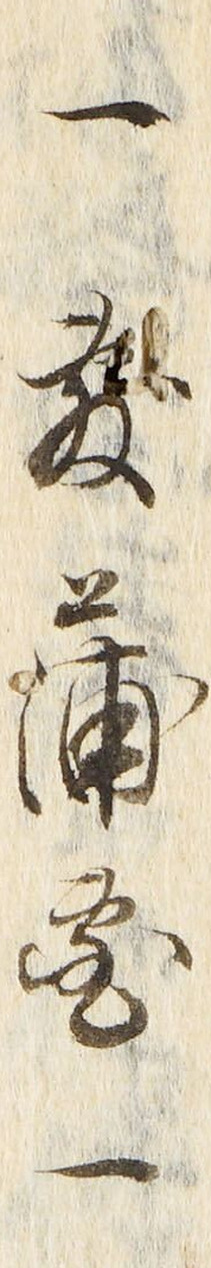一敷蒲団一
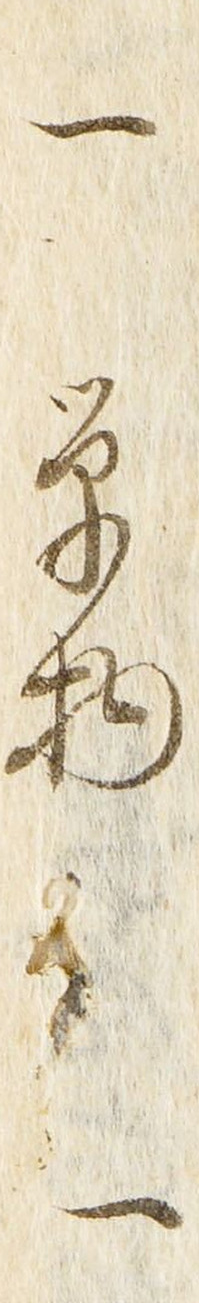一単物一

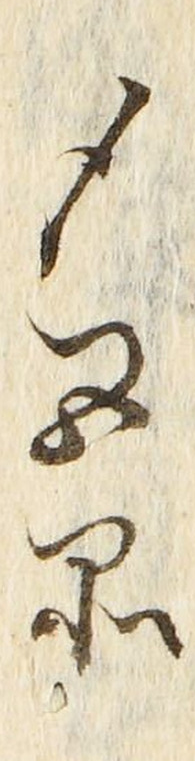〆五品
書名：唐物語
